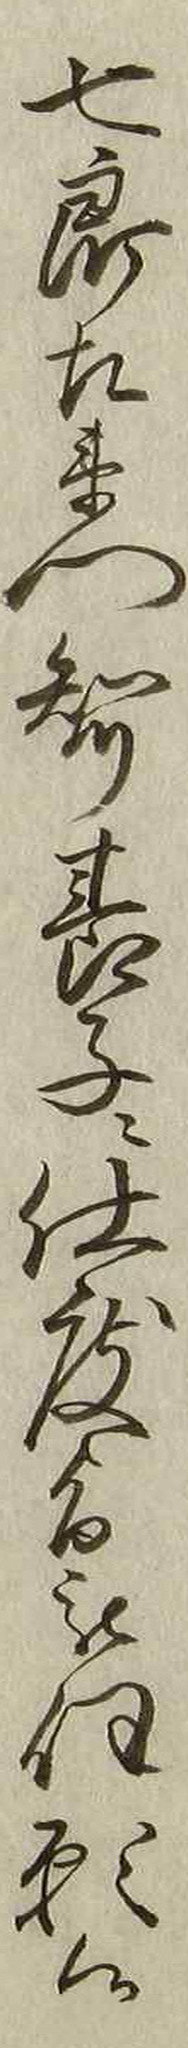七郎左衛門聟養子ニ仕度旨被任願候
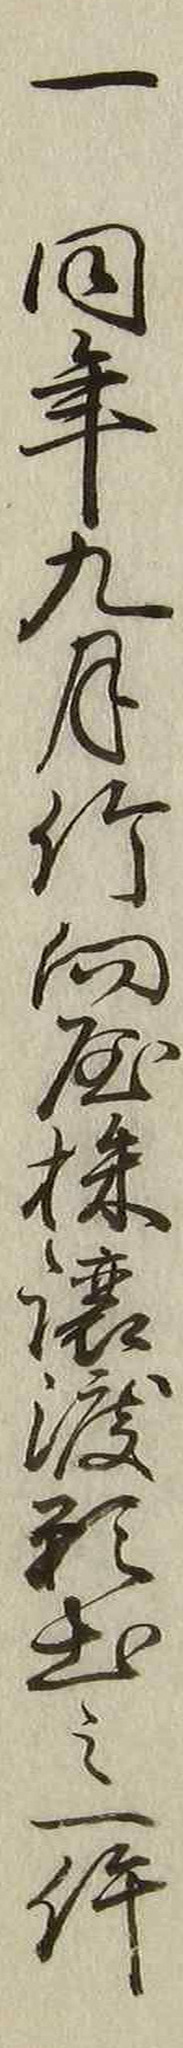一同年九月竹問屋株譲渡願出之一件
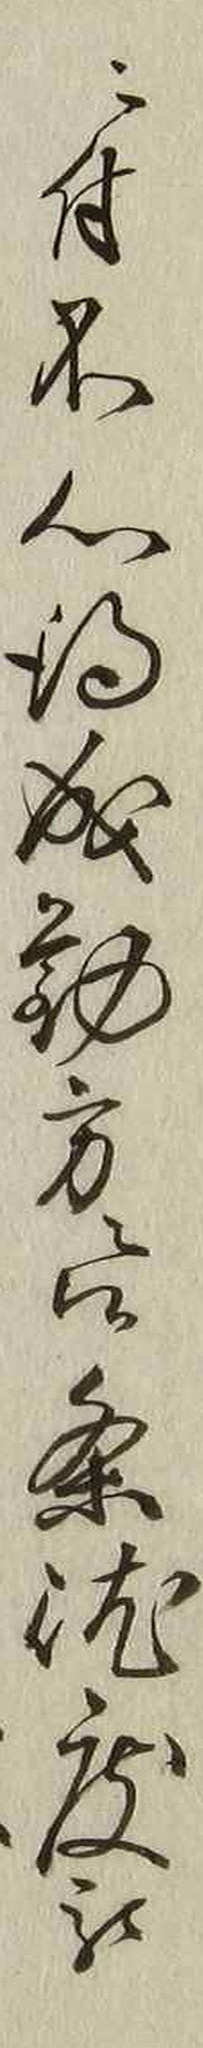ニ付不心得成勤方ニ候条屹度被
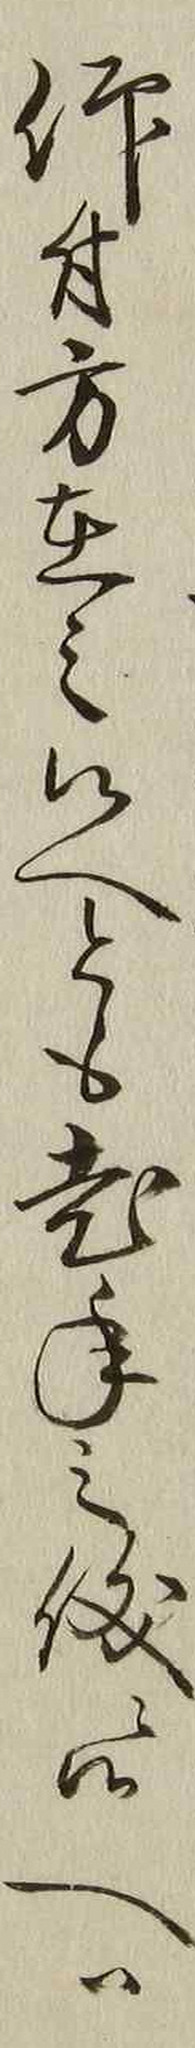仰付方在之候へとも老年之儀ニ候へハ
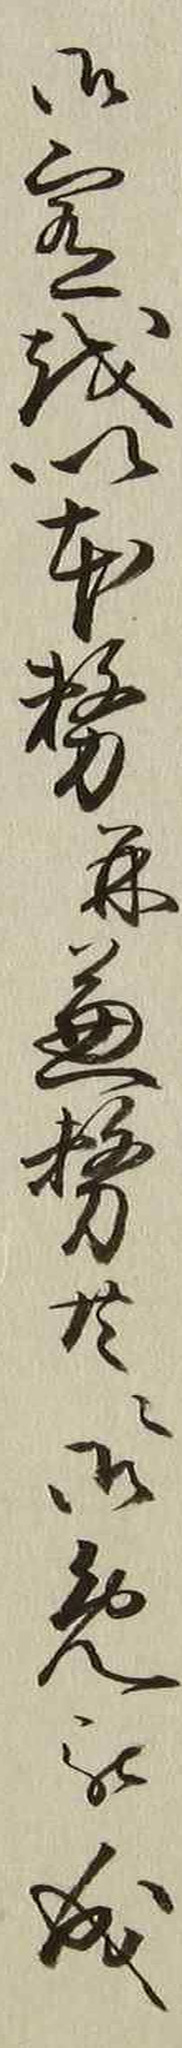御宥を以本務并兼務共ニ御免被成
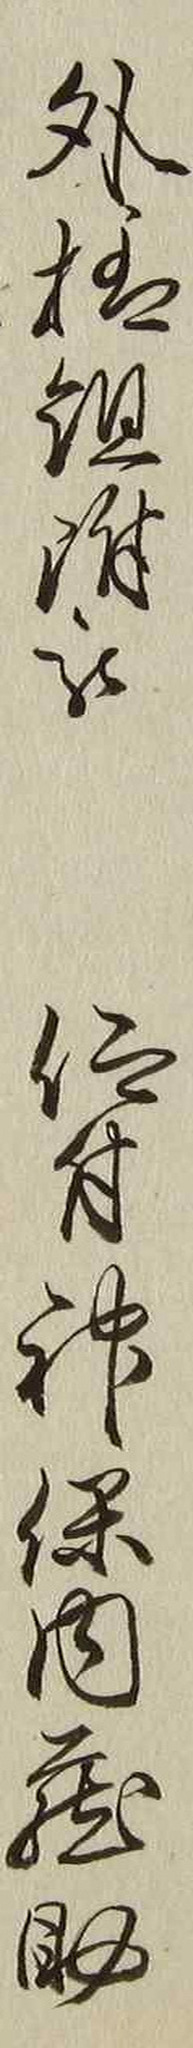外様組附被仰付神保内蔵助
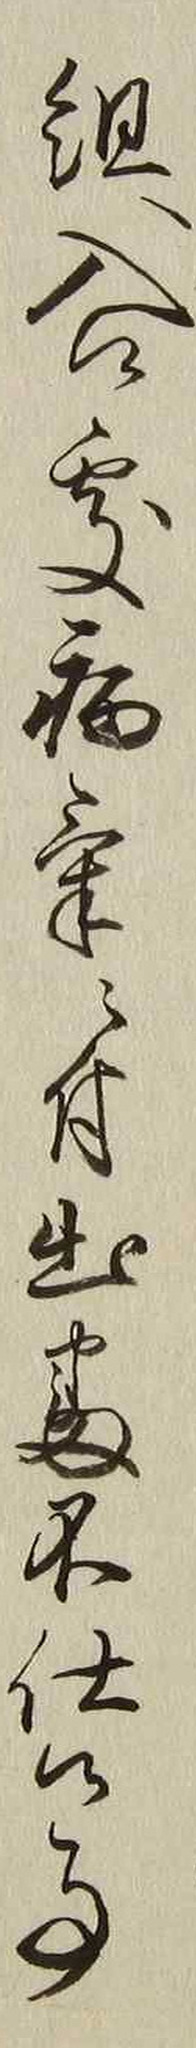組へ入候処病気ニ付出番不仕候事
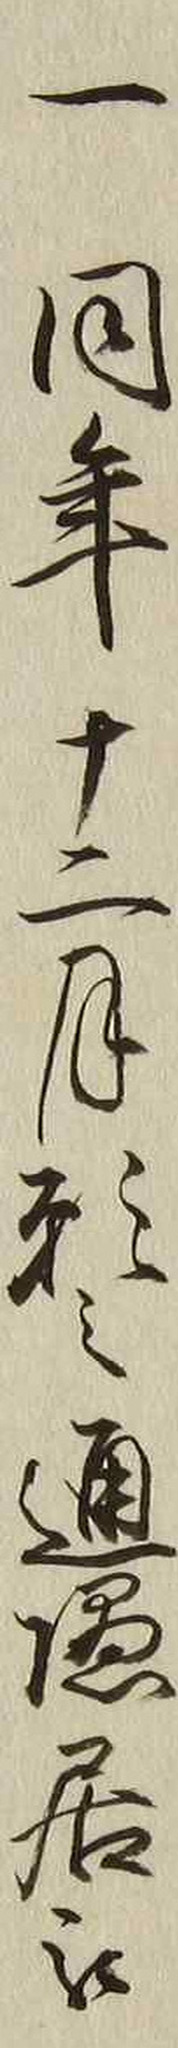一同年十二月願之通隠居被
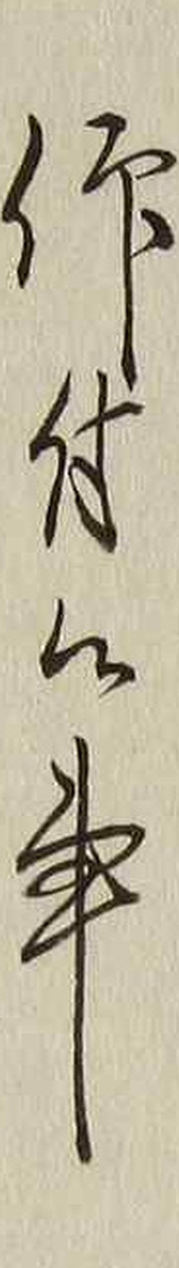仰付候事
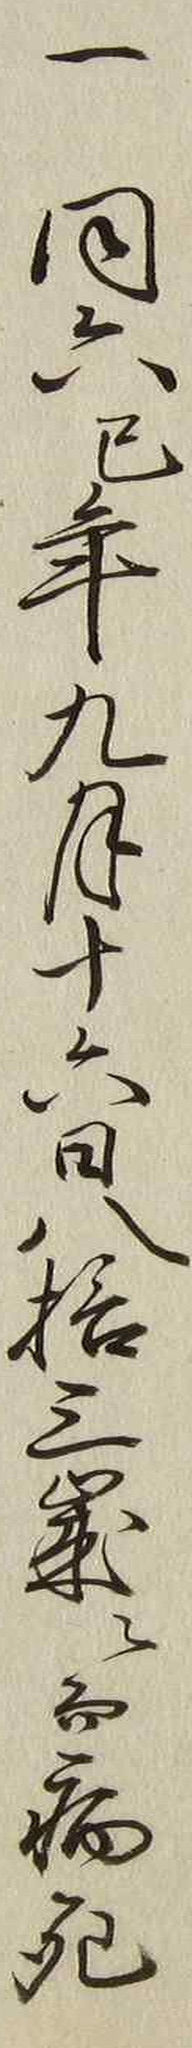一同六巳年九月十六日八拾三歳ニ而病死
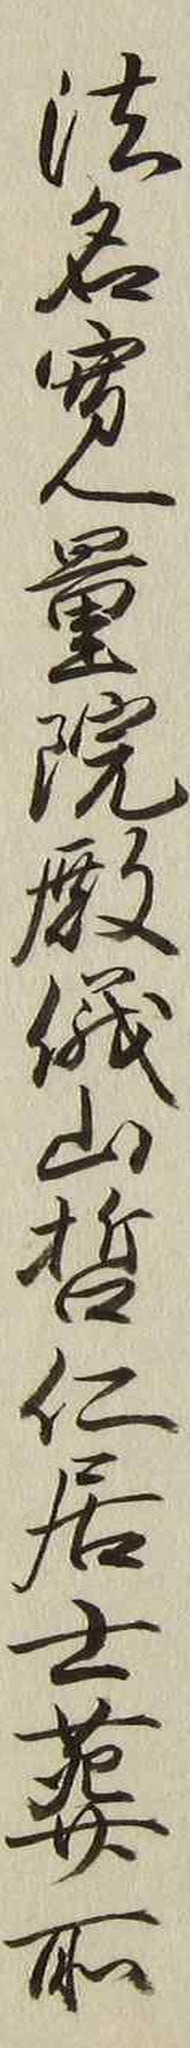法名寛量院殿儀山哲仁居士葬所
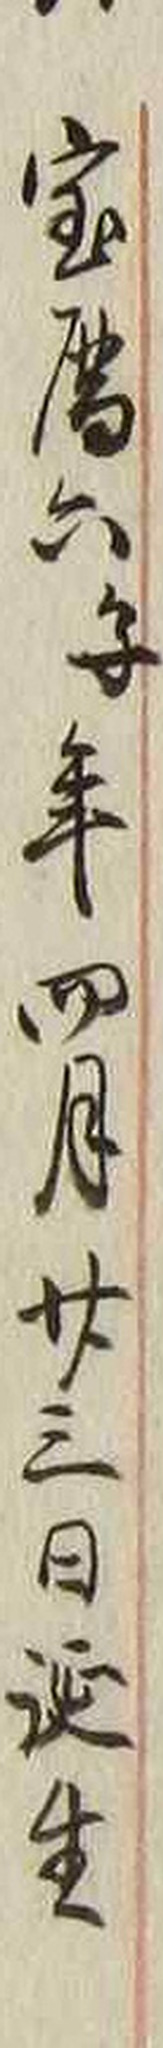宝暦六子年四月廿三日延生
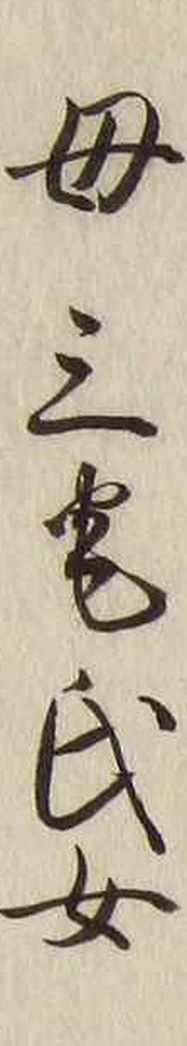母三宅氏女

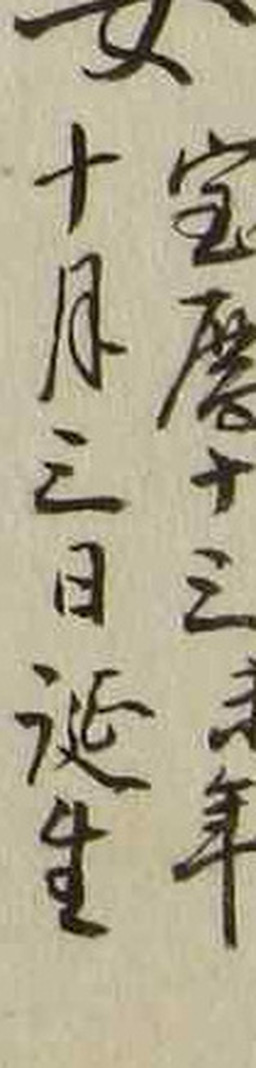十月三日誕生
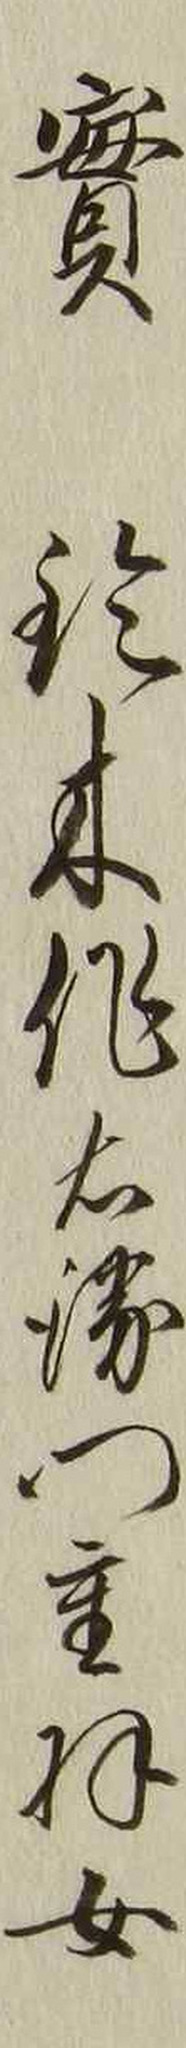実鈴木作右衛門重羽女
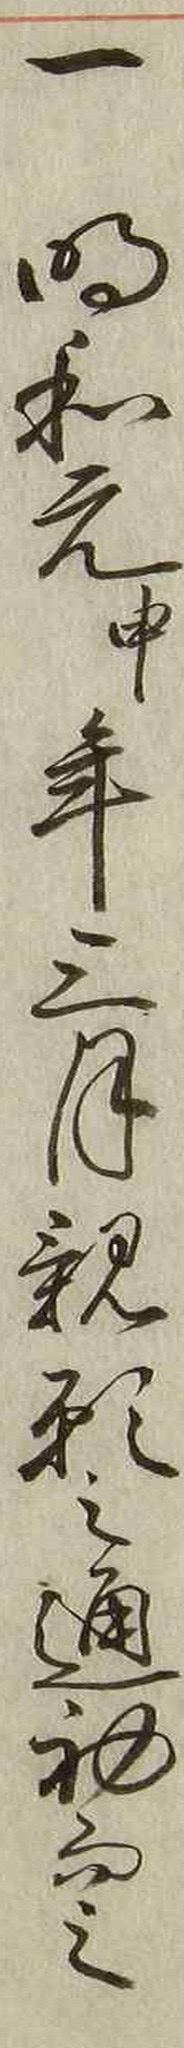一明和元申年三月親願之通初而之
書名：諸士系譜　巻之21　い之部21
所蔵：会津若松市立会津図書館
